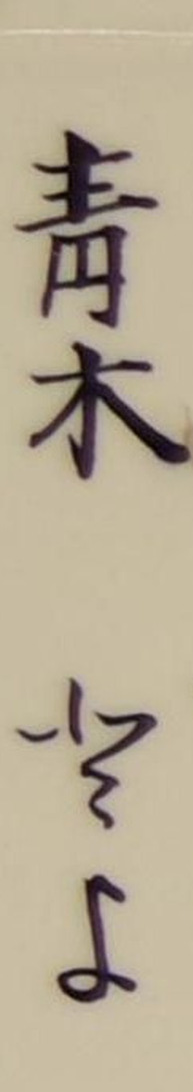青木とよ

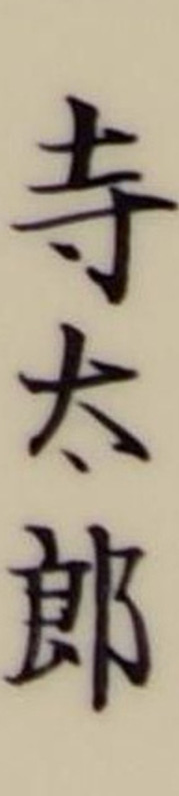寺太郎
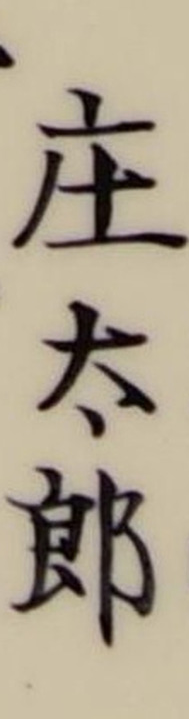庄太郎
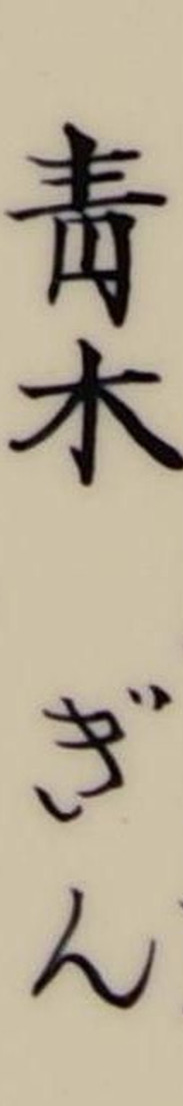青木ぎん
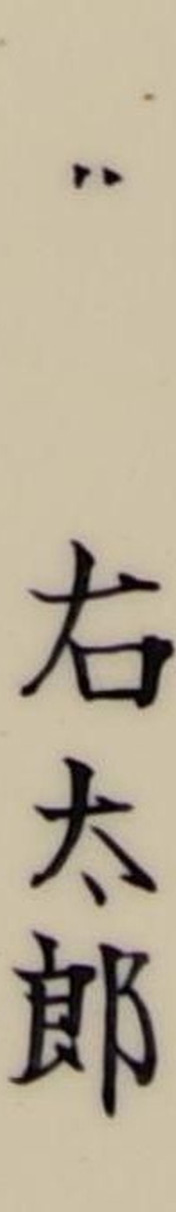右太郎
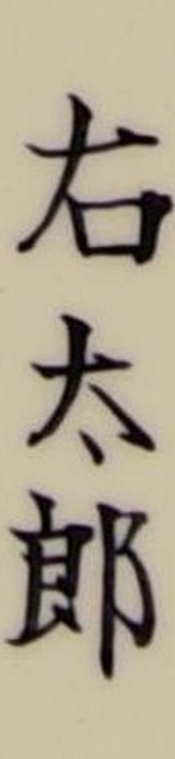右太郎
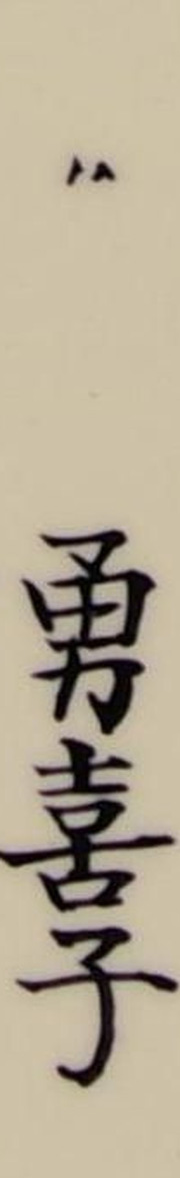勇喜子
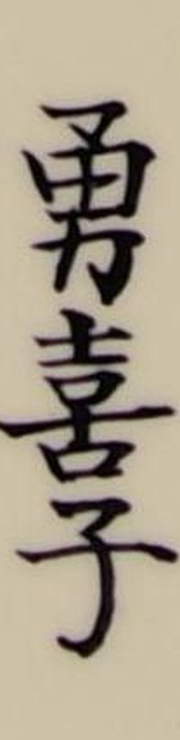勇喜子
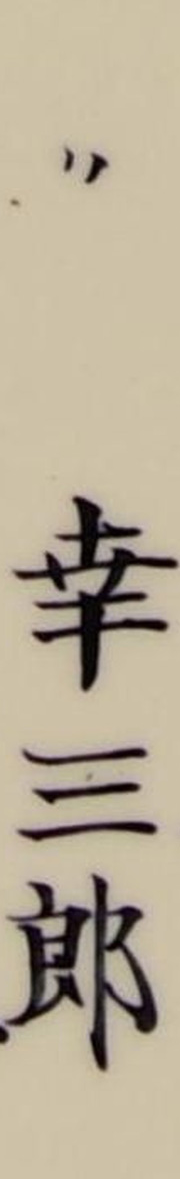幸三郎
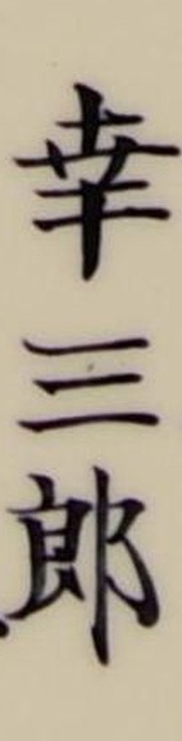幸三郎
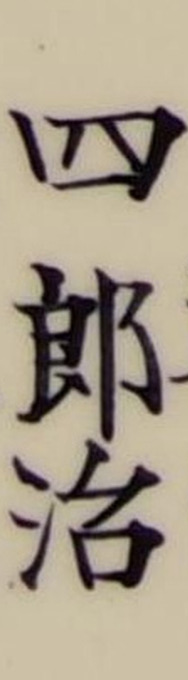四郎治
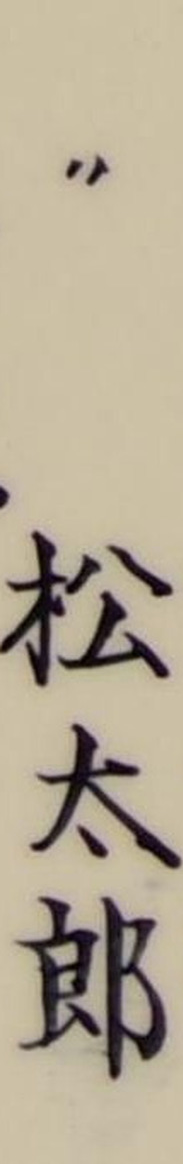松太郎
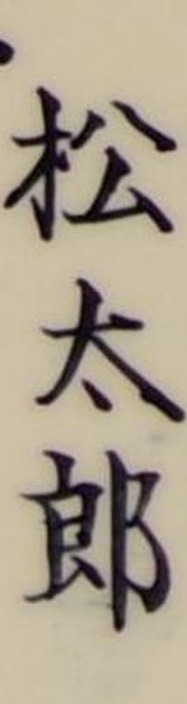松太郎
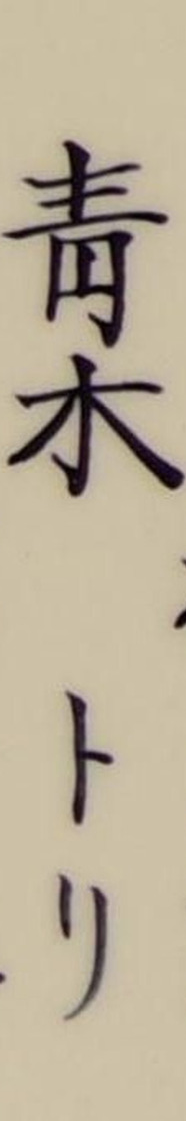青木トリ
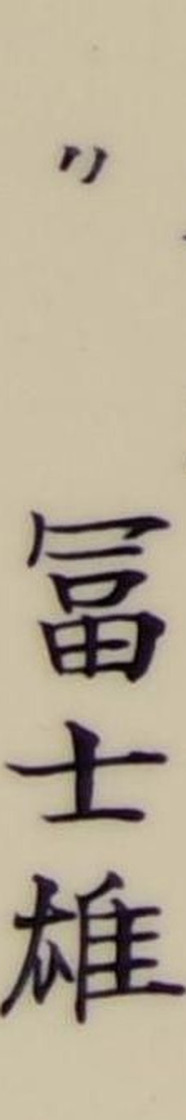冨士雄
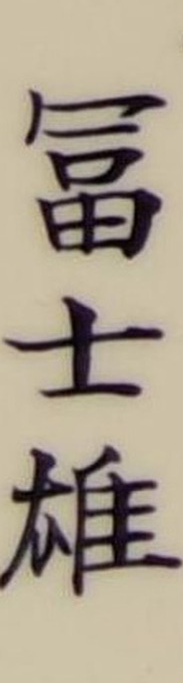冨士雄
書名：E~L
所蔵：高野山金剛峯寺
